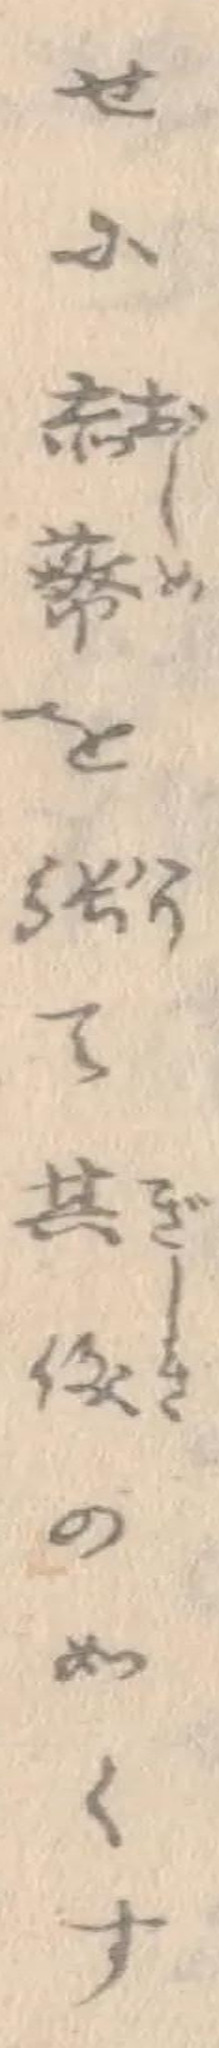せに赤幣を張て其儀の如くす
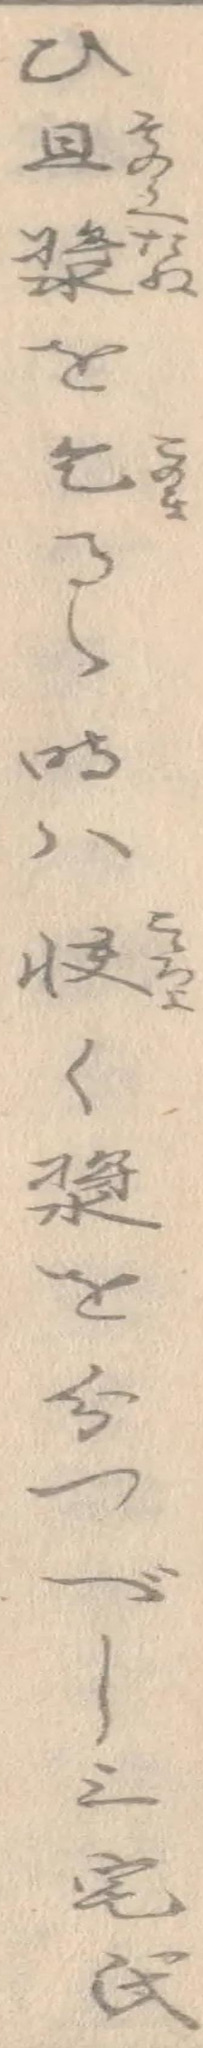ひ且漿乞るゝ時は快く漿を分つべし三宅氏
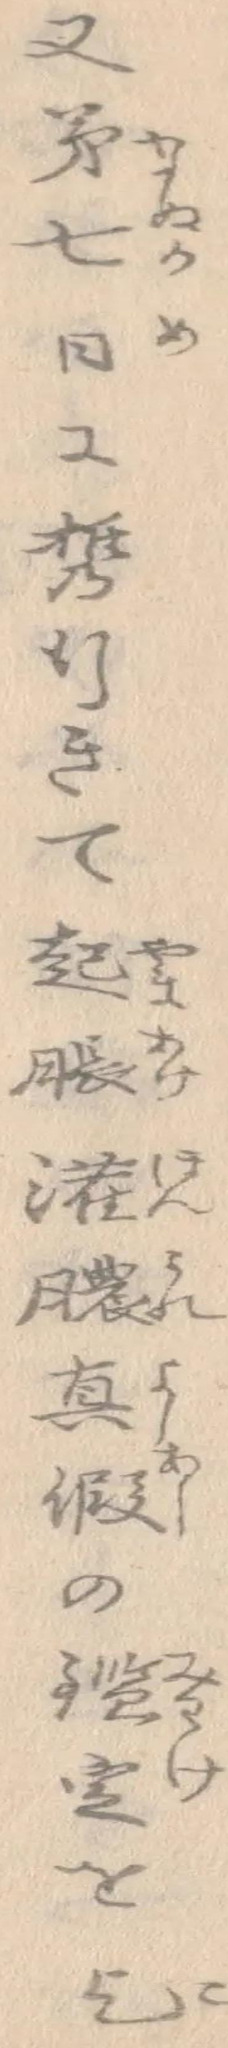又第七日に携行きて起脹潅膿真假の鑑定を乞
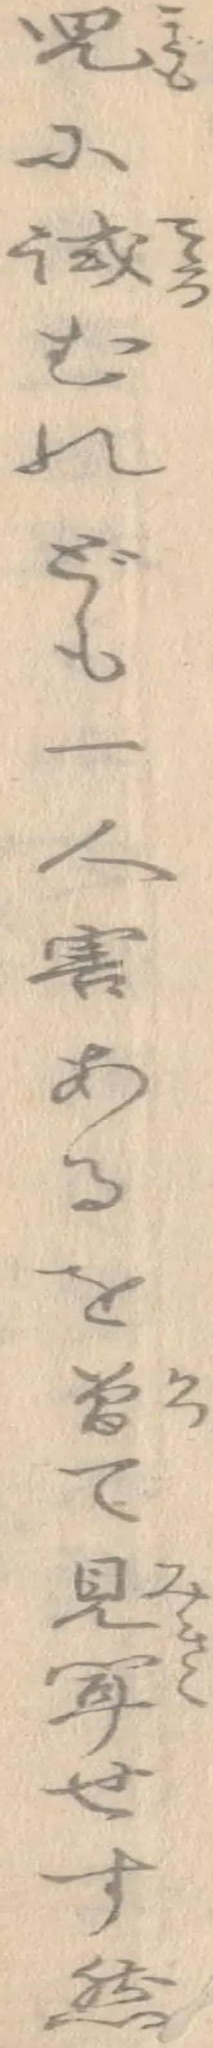児に試むれども一人害あるを曽て見聞せす然
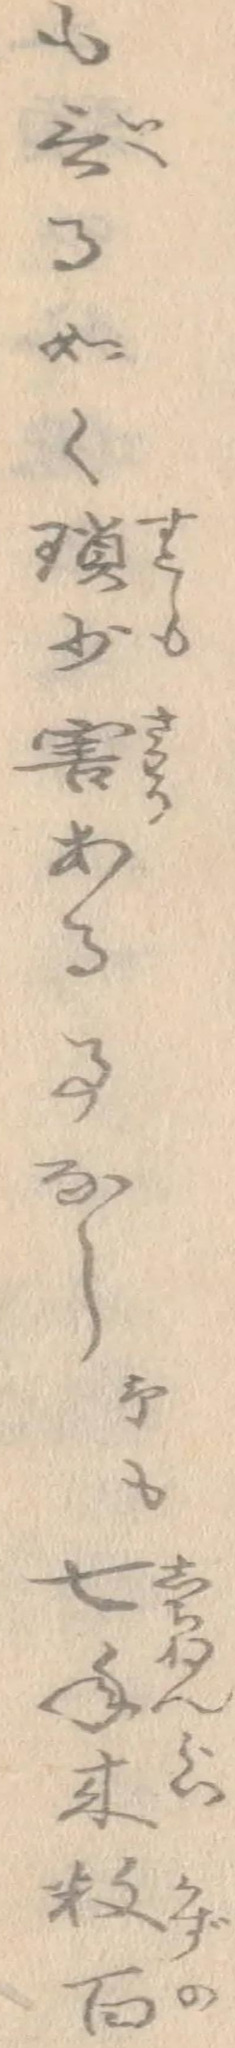も言る如く瑣少害ある事なし予も七年来数百

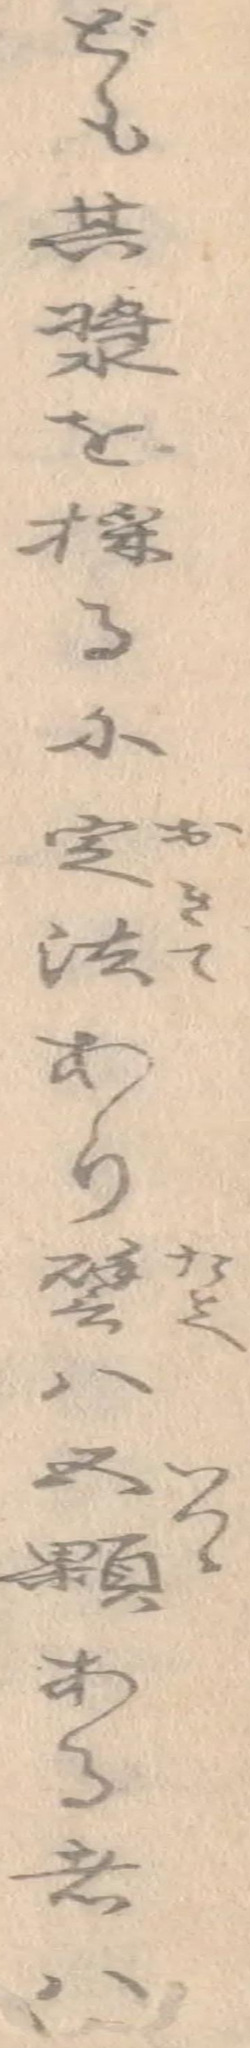ども其漿を採るに定法あり譬は五顆ある者は
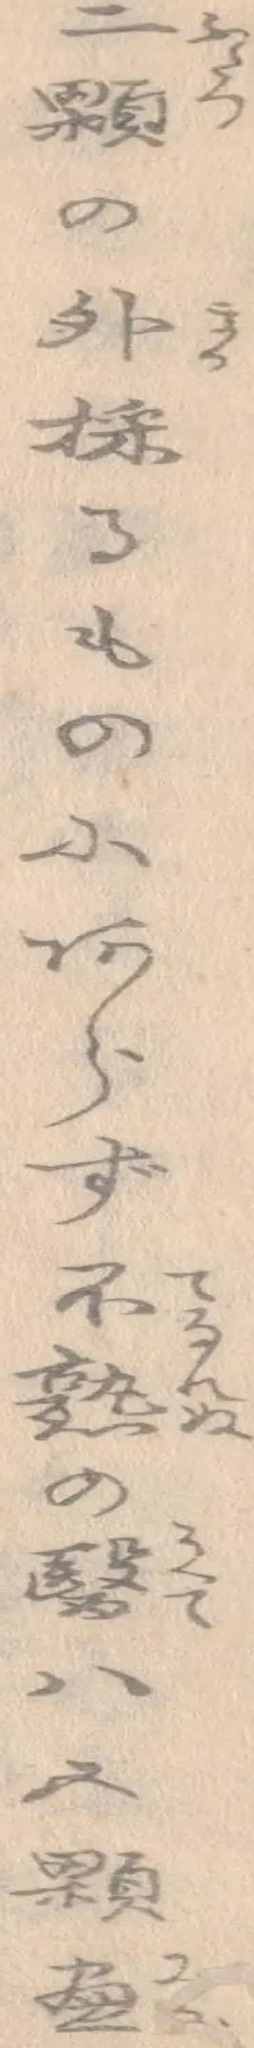二顆の外採るものにあらず不熱の醫は五顆盡
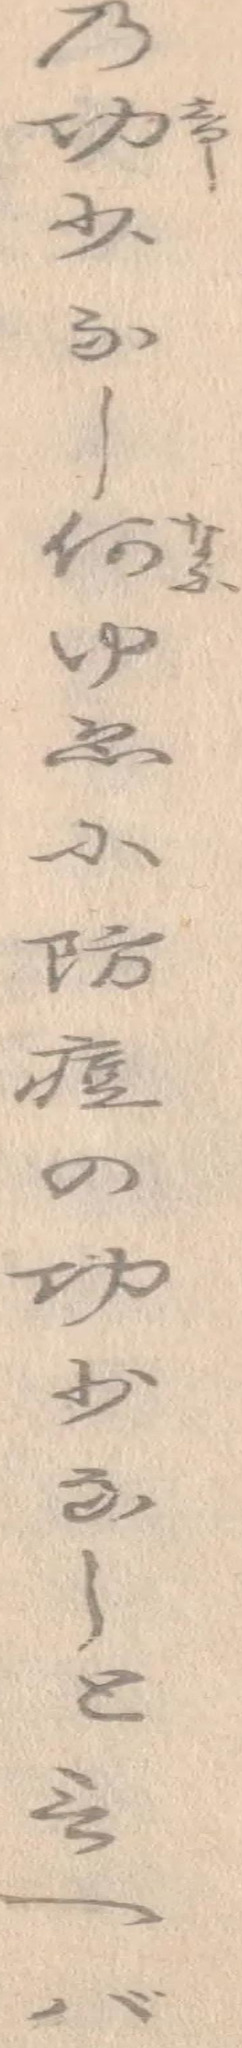の功少なし何ゆゑに防痘の功少なしと言へば
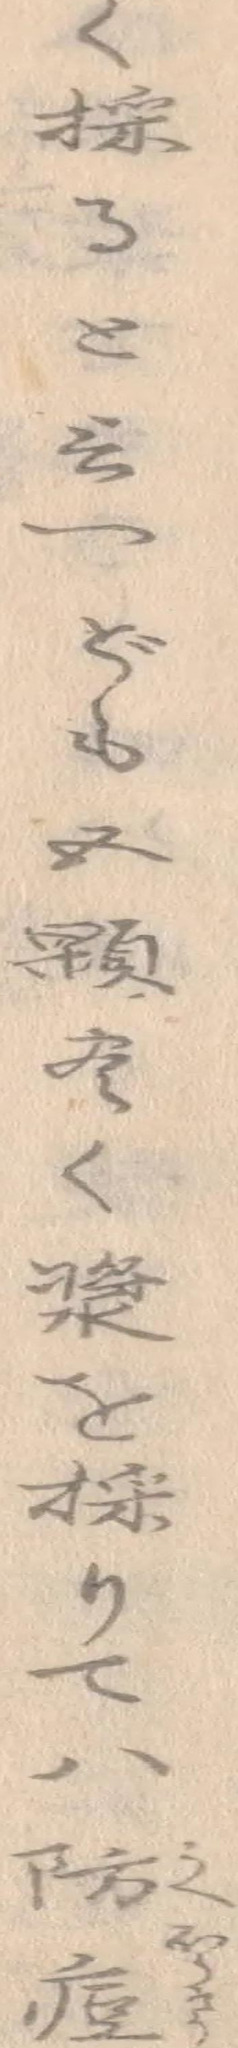く採ると言へども五顆盡く漿を採りては防痘
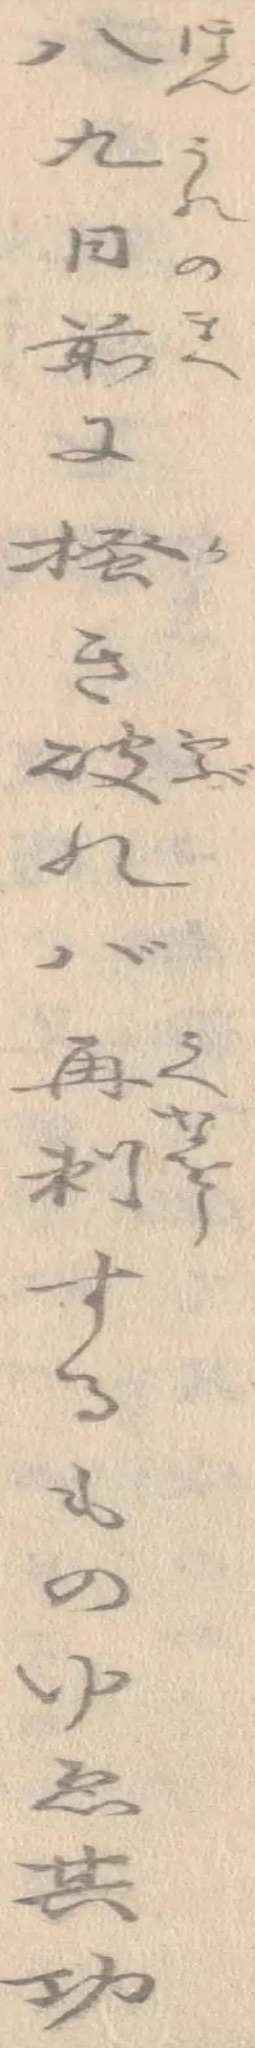八九日前に掻き破れば再剃するものゆゑ其功
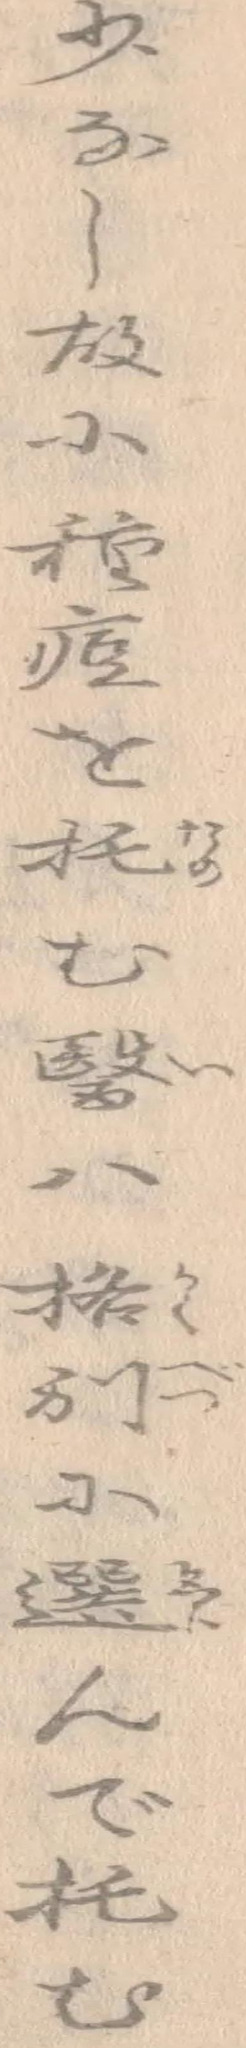少なし故に種痘を托む醫は格別に選んで托む
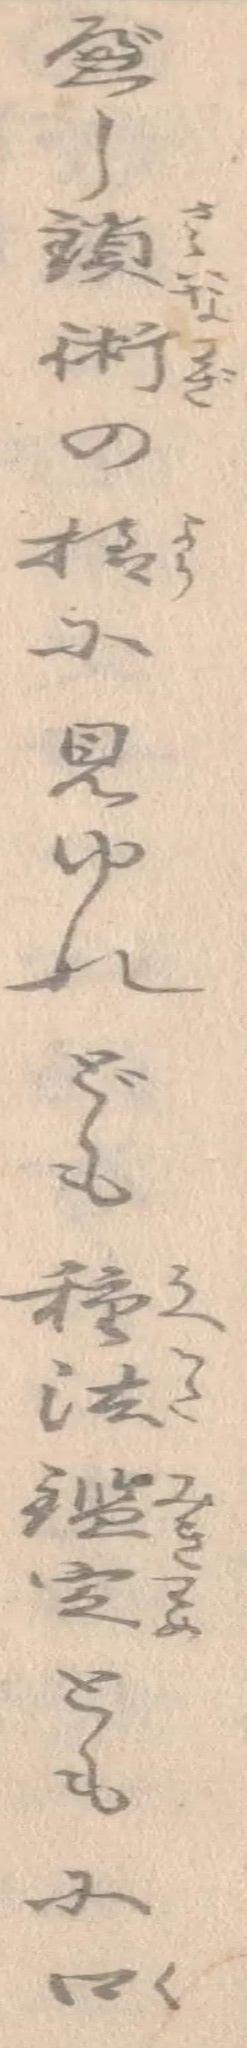べし鎖術の様に見ゆれども種法鑑定ともに口
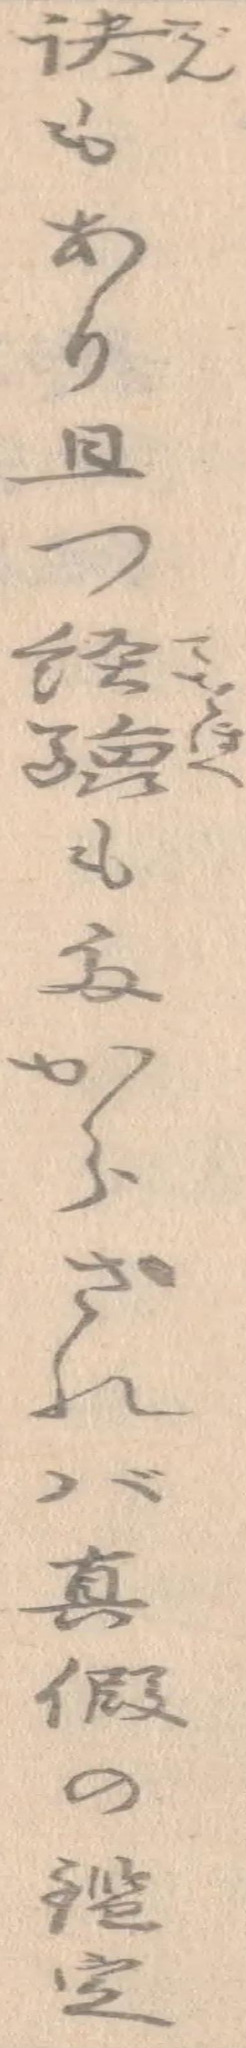訣もあり且つ経験も多からざれば真仮の鑑定
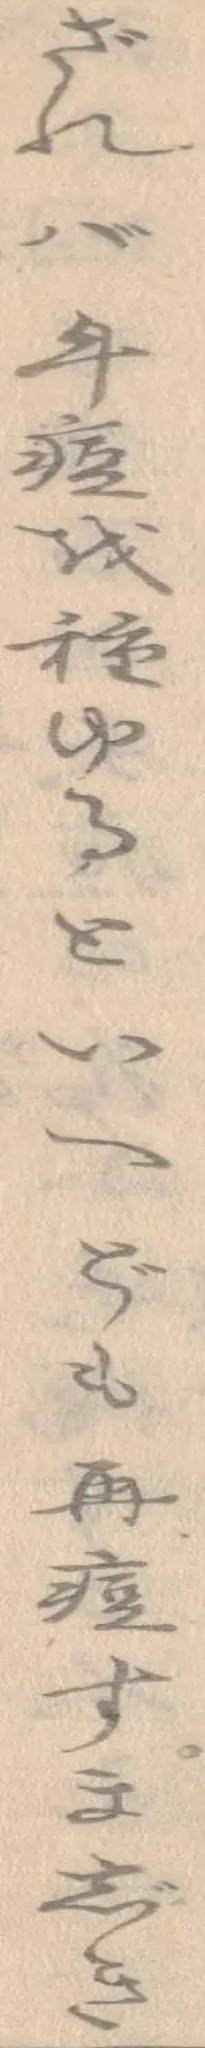ざれば牛痘を種ゆるといへども再痘すまじき
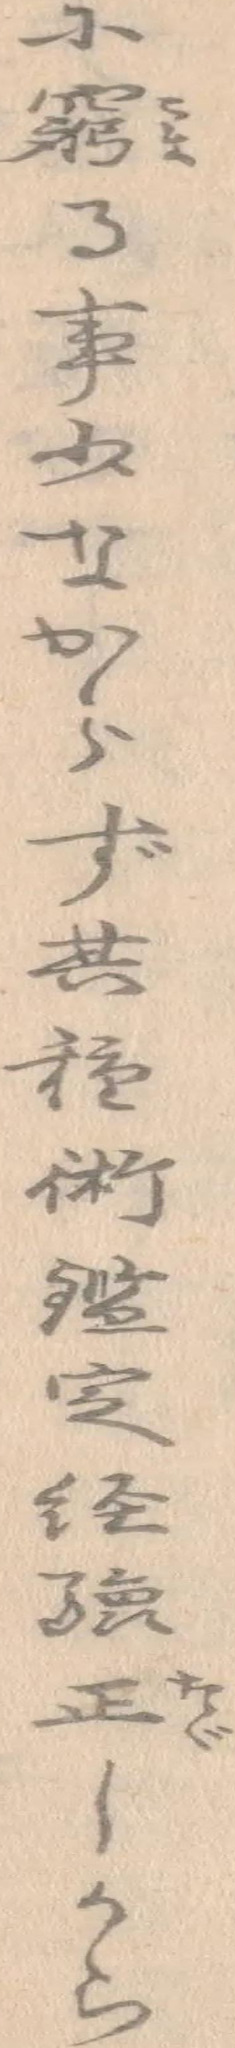に窮る事少なからず其種術鑑定経験正しから
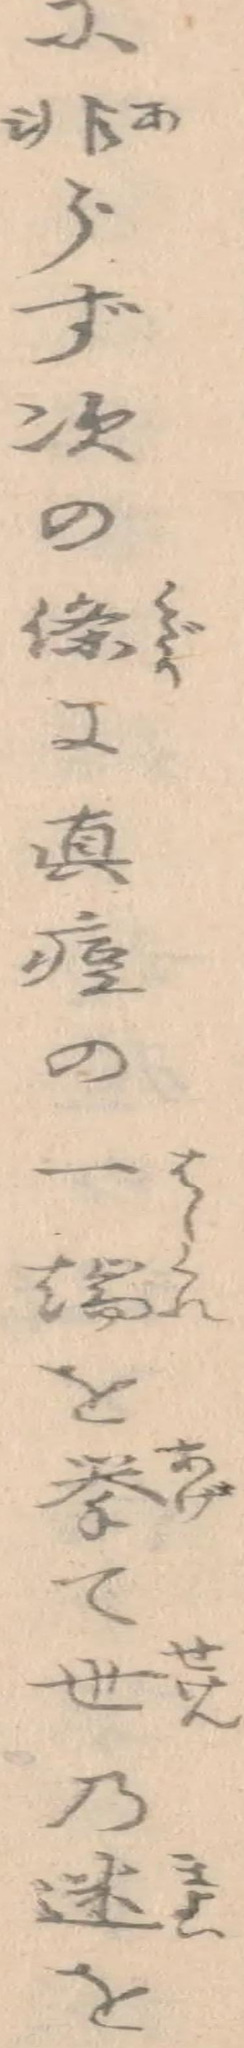に非らず次の條に真痘の一端を挙て世の迷を
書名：散花養生訓
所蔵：国立国会図書館 National Diet Library, JAPAN
